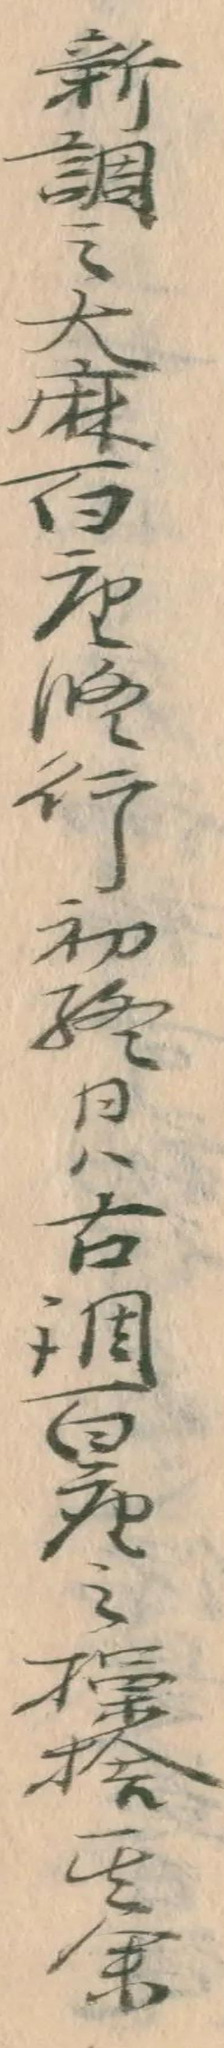新調之大麻百座修行初終日ハ古調百座之繰捨其余
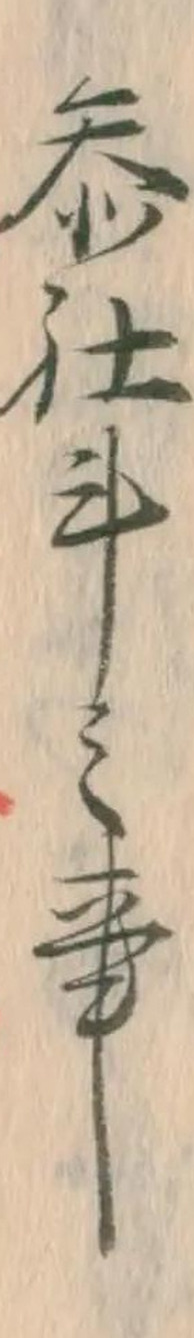参社斗之事
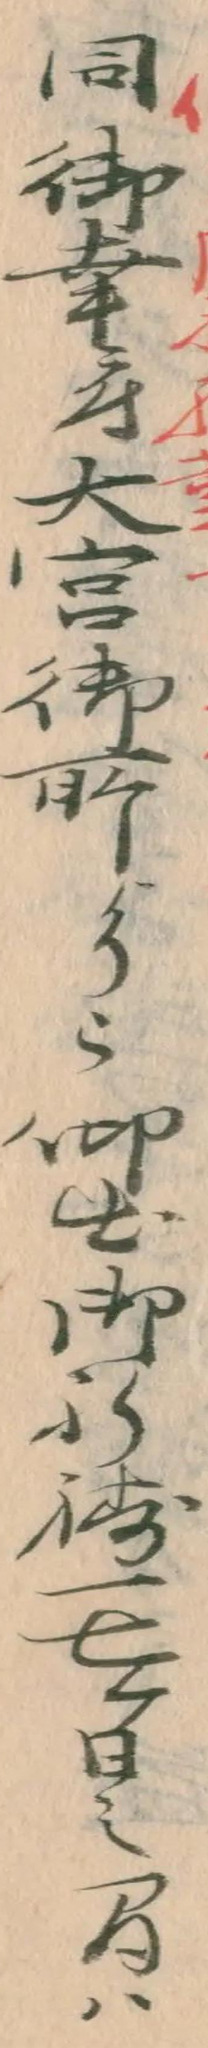同御幸ニ付大宮御所より被仰出御祈祷一七ケ日之間ハ
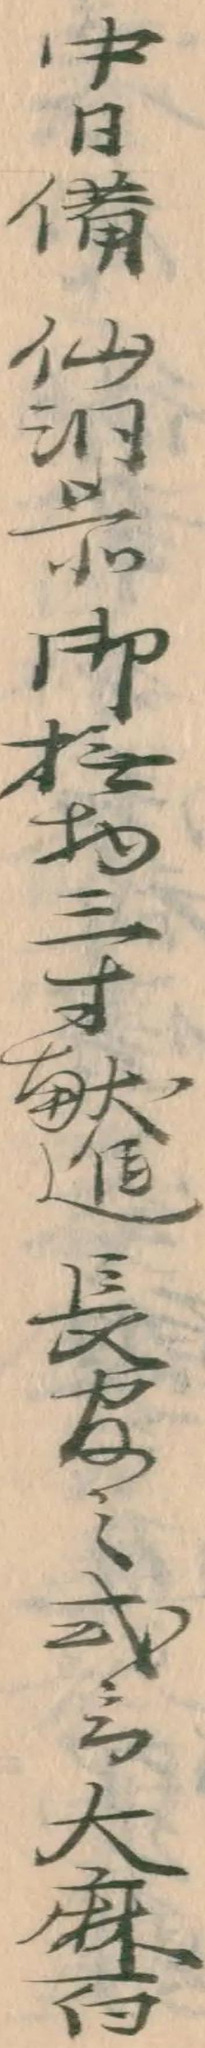中日備仙洞御所御撫物三寸献進長官之式ニ而大麻百
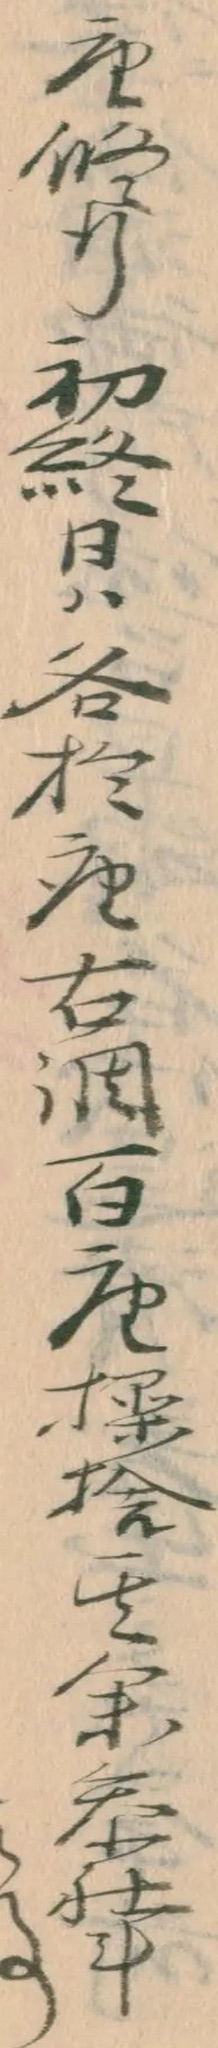座修行初終日ハ各於座古調百座操捨其余参社斗之事
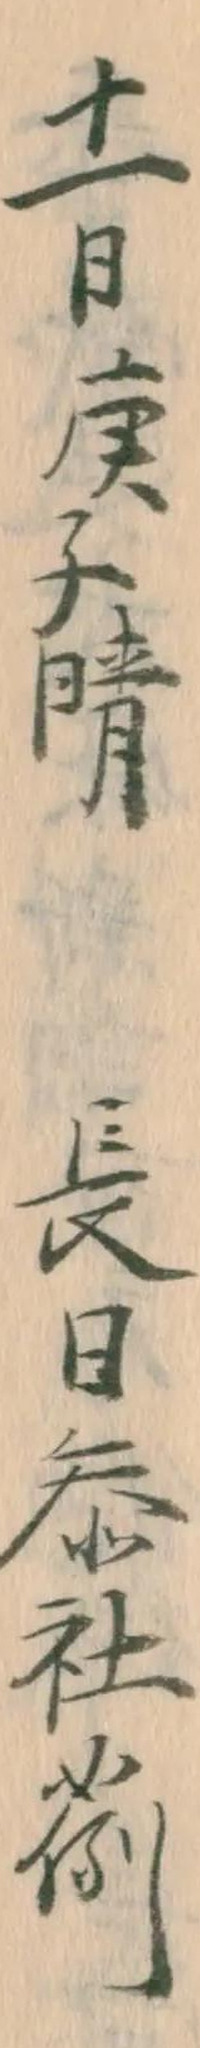十一日庚子晴長日参社如例
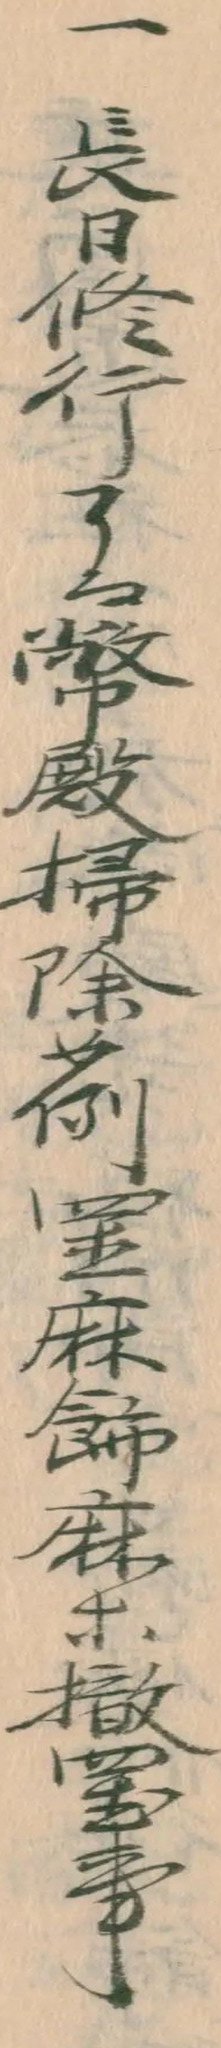一長日修行了而幣殿掃除如例置麻飾麻等撒置事
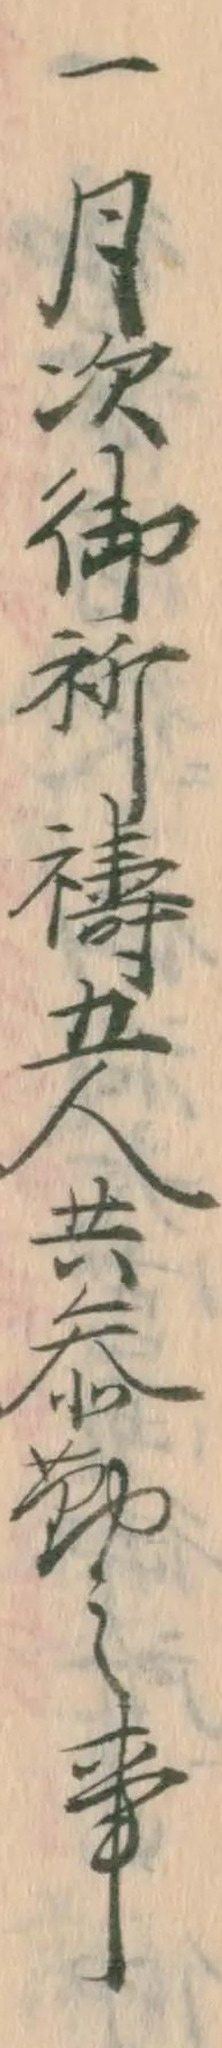一月次御祈祷五人共参勤之事
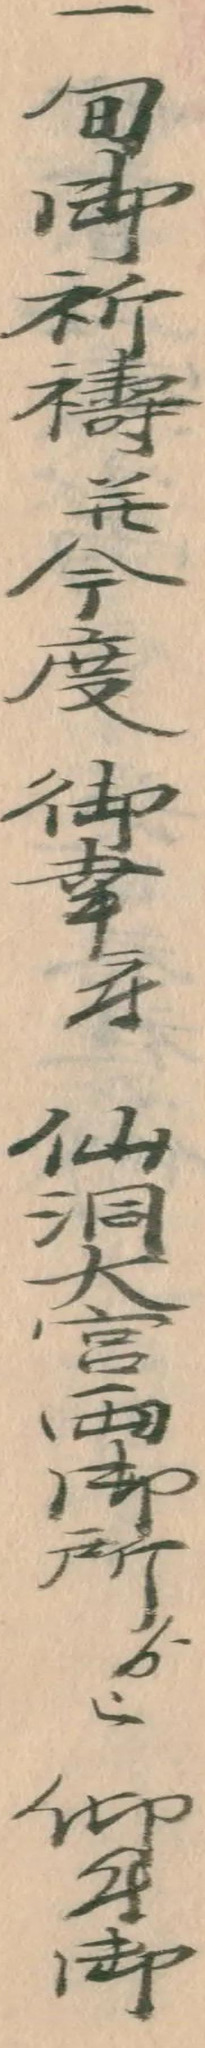一旬御祈祷并今度御幸ニ付仙洞大宮両御所ゟ被仰付御
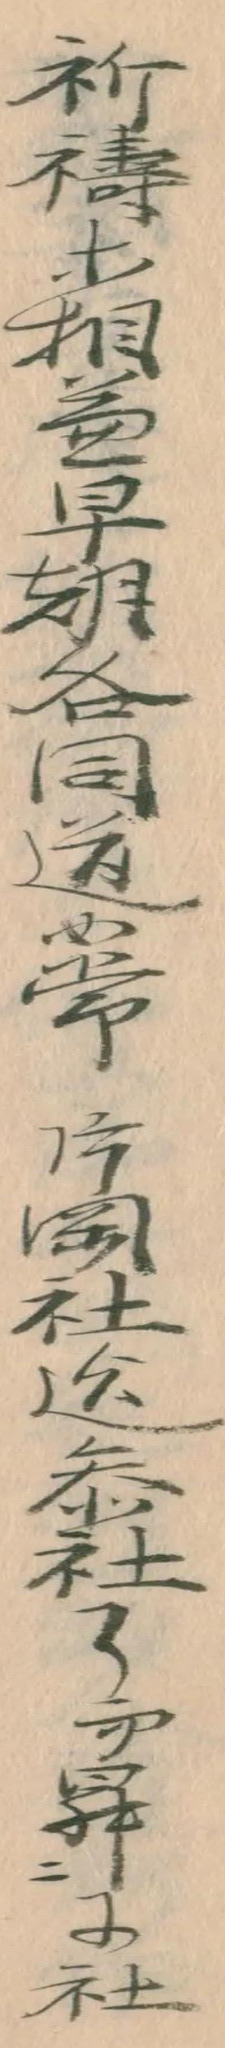祈祷等相兼早朝各同道如常片岡社迄参社了而昇に社
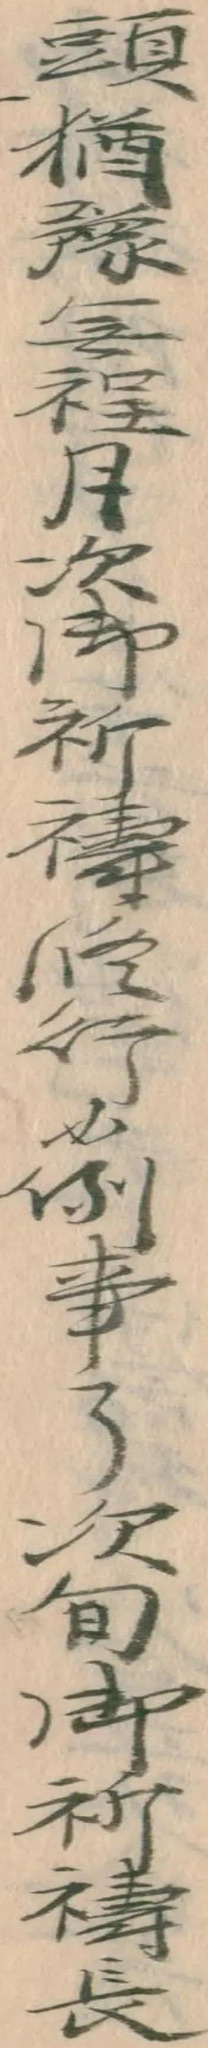頭猶豫無程月次御祈祷修行如例事了次旬御祈禱長
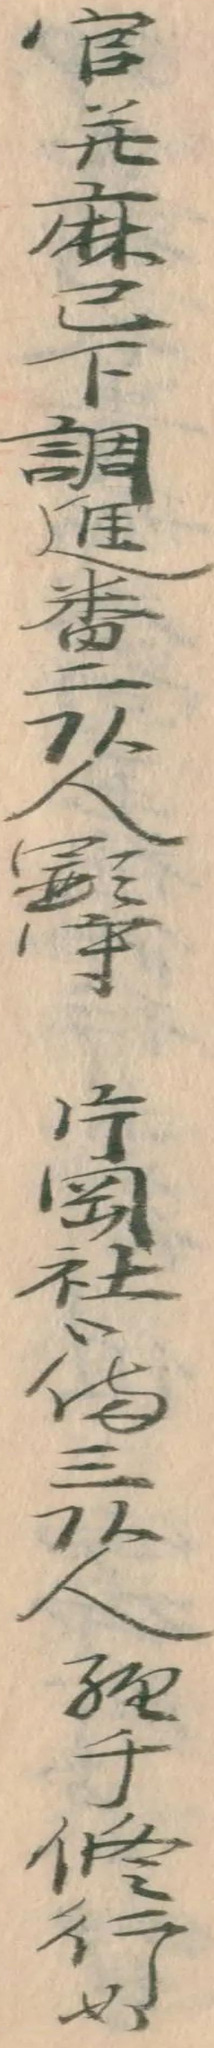官并麻已下調進番二頭人顕守片岡社御備三頭人経千修行如
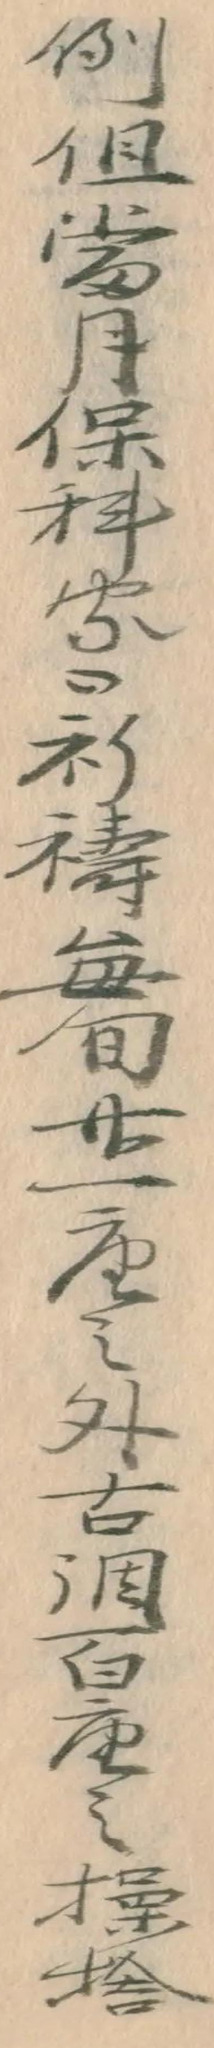例但當月保科家御祈祷毎旬廿一座之外古調百座之操捨
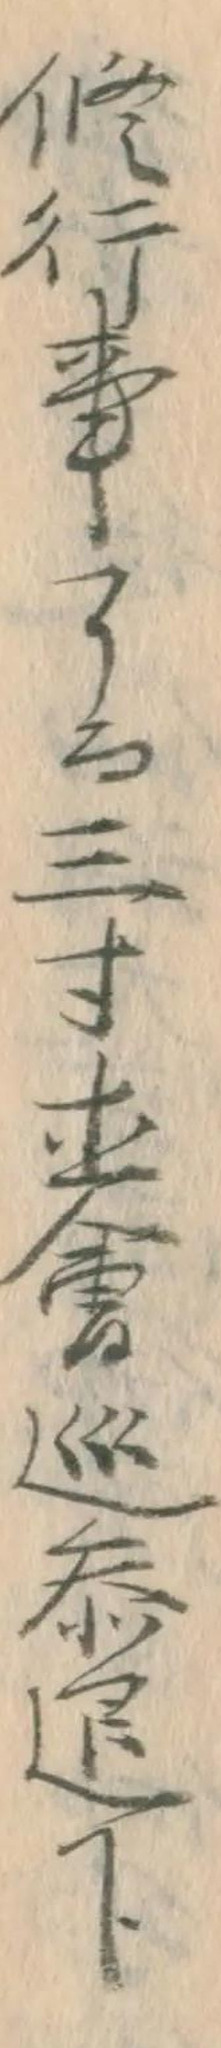修行事了而三寸直會巡参退下
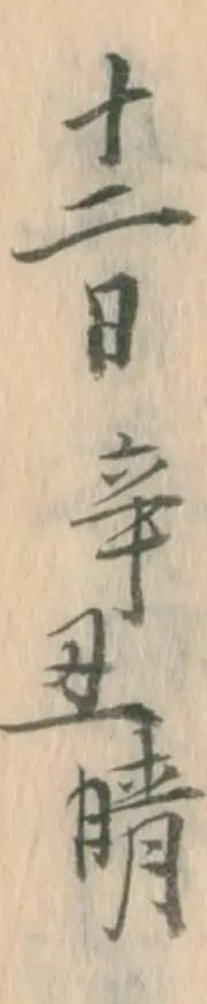十二日辛丑晴

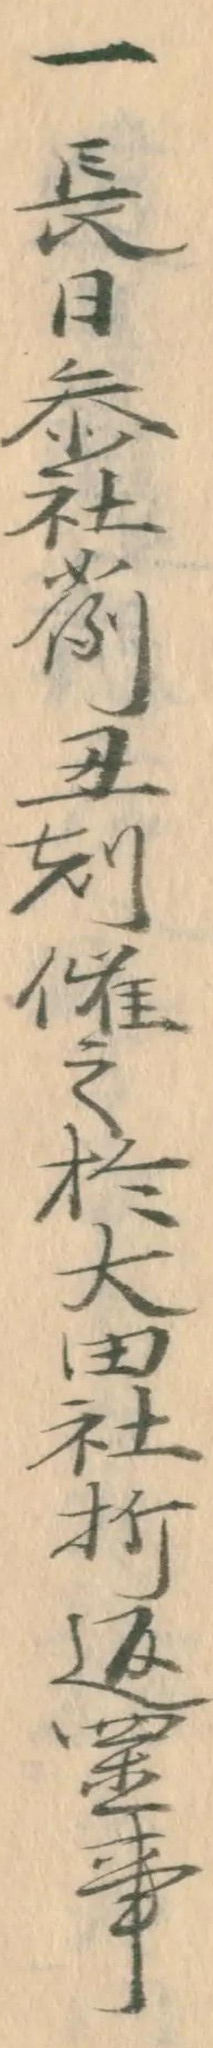一長日参社如例丑刻催之於大田社折返置事
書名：賀茂社記録. 第74冊
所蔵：国立国会図書館 National Diet Library, JAPAN
